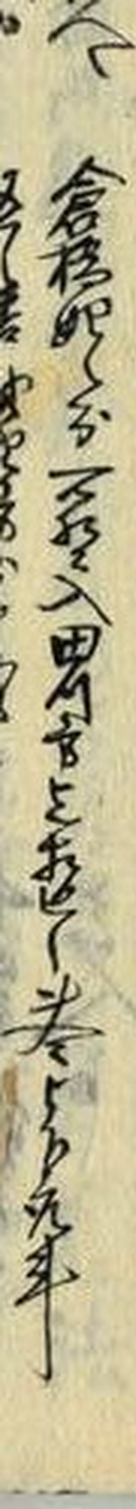倉橋始之分一箱ニ入田川方迄相廻し夫々被下取計
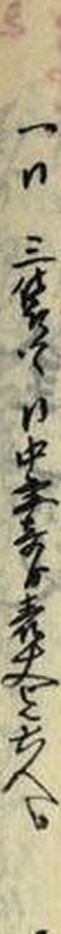一同三袋ツヽ御中年寄ゟ表使迄六人へ
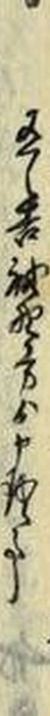有之筈袖野方ゟ申越候事
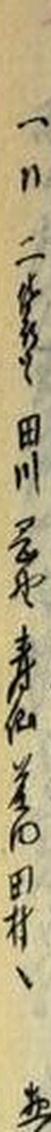一同二袋ツヽ田川岡野寿仙藤田田村へ
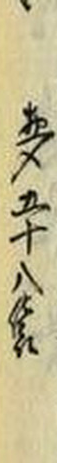惣〆五十八袋
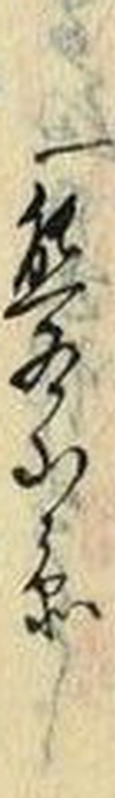熊谷小兵衛
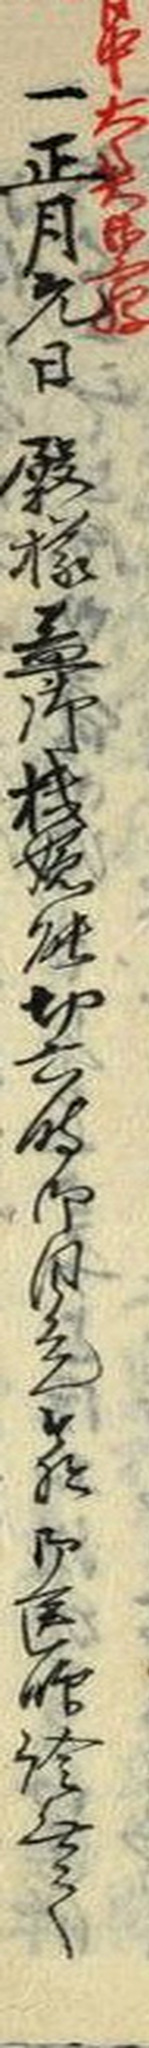一正月元日殿様益御機嫌能切六時御目覚被遊御医師診無之
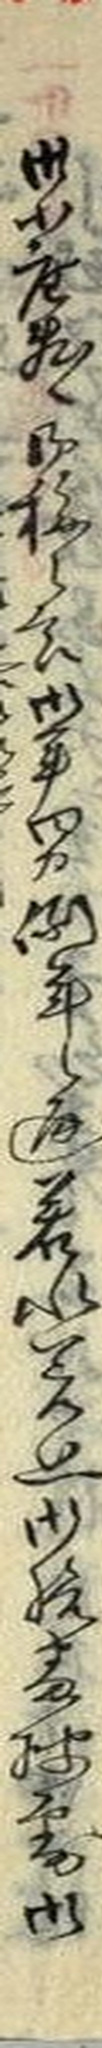御小座敷へ御移之節御年男例年之通若水差上御膳番披露御
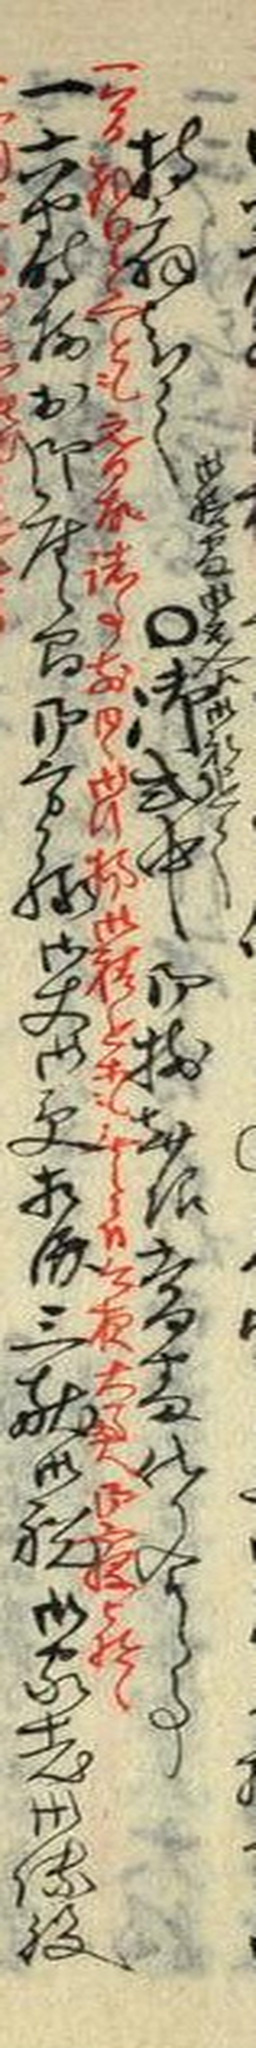一六半時揃於御座之間御方々様御使御受相済三献御祝御家老御傅役
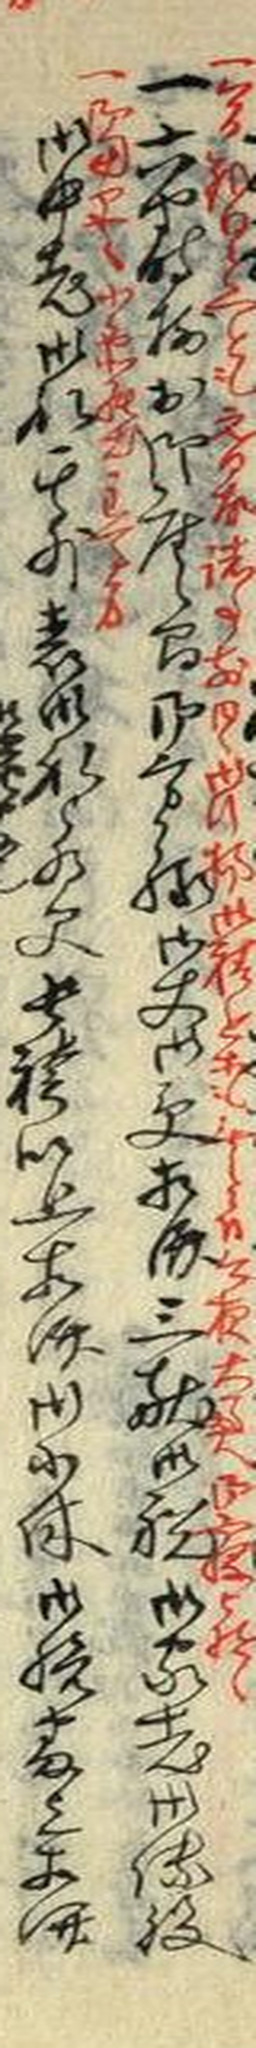御中老御礼其外表御礼被為受長袴以上相済御小休御膳番迄相済
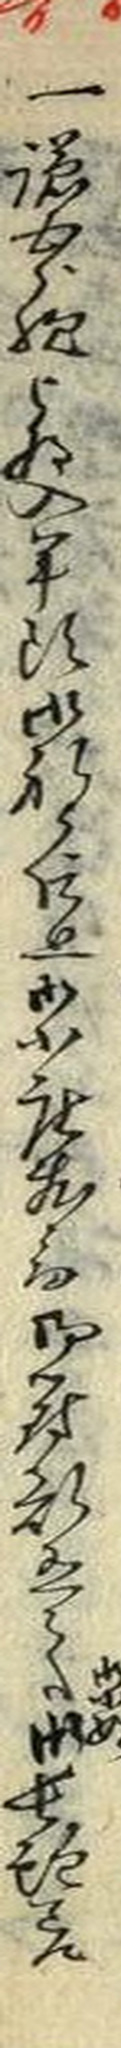一謙五郎様被為入年頭御礼被仰上御小座敷ニ而御対顔有之御小姓御長鮑差
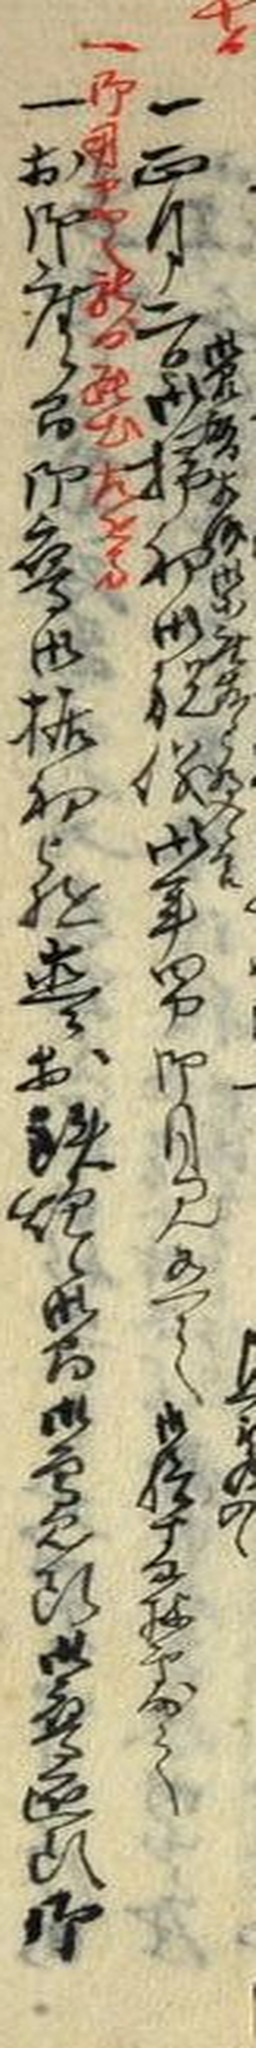一於御座之間御鷹御据初被遊直ニ於鉄炮之御間御鳥見頭御鷹匠頭御

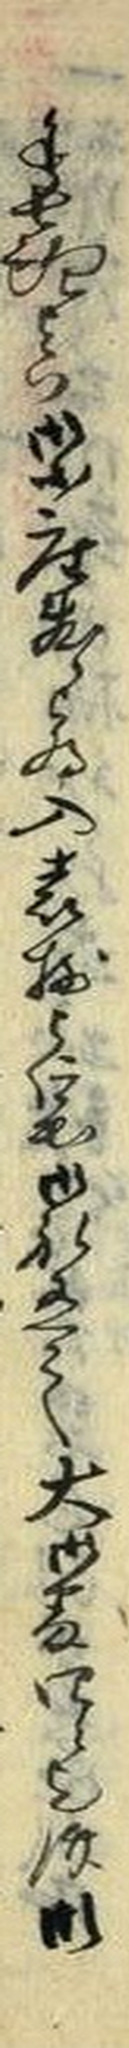手長鮑被下御小座敷へ被為入表揃被仰出御礼有之大御番四同迄済御
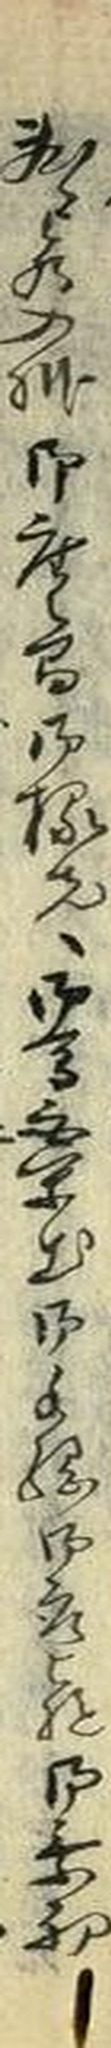敷へ被為入掛御座之間御縁先へ御馬牽出御手綱御取被遊御乗初
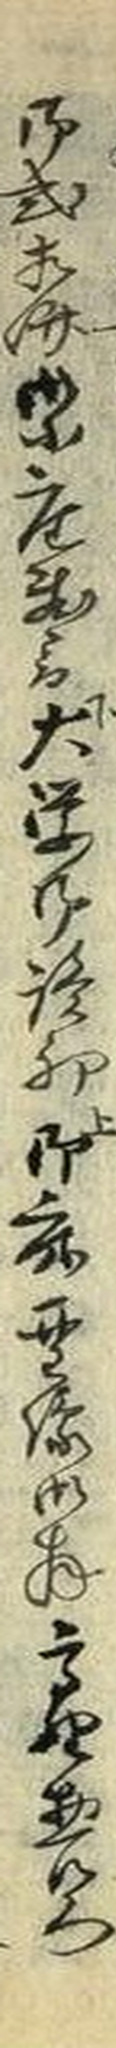御式相済御小座敷ニ而大学読初御床聖像御拝高野惣左衛門
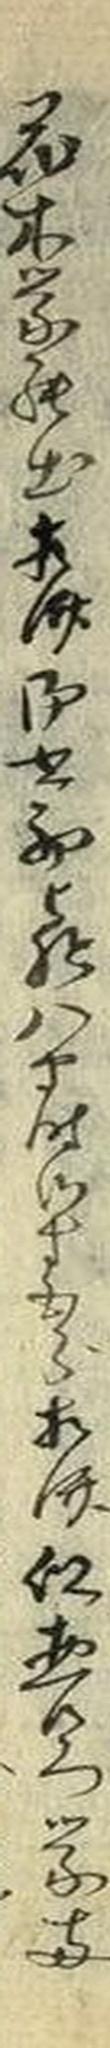花木栄罷出相済御書初被遊八半時弐寸五分相済但惣左衛門栄両
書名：少傅日録抄（斉承付側向頭取日記、在国）
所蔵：福井県文書館 Fukui Prefectural Archives
